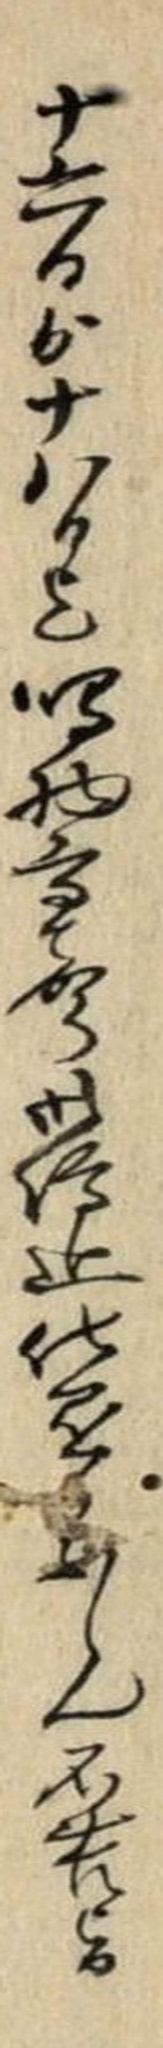十六日ゟ十八日迄鳴物高声御停止仕懸りふしん不苦旨
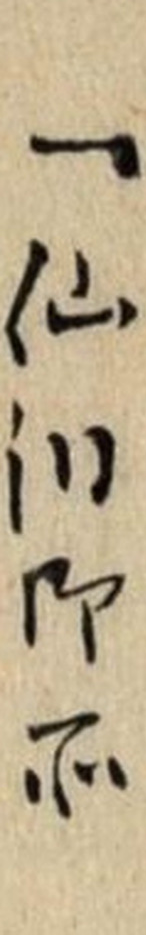一仙洞御所
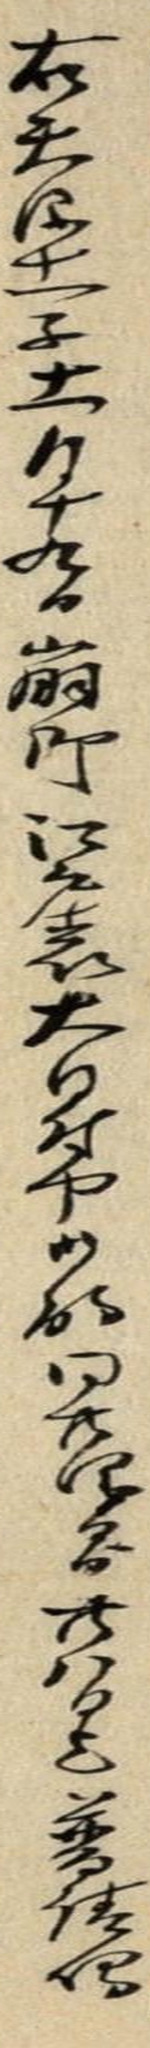右天保十一子十一月十九日崩御江戸表大目付中御触同廿四日ゟ廿八日迄普請鳴
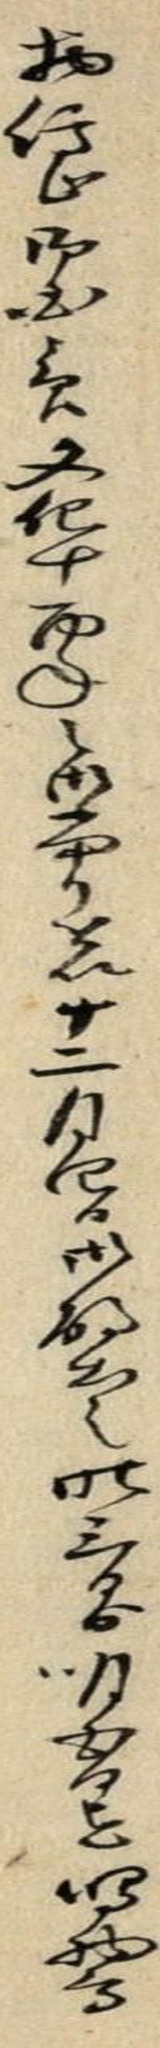物停止御国にては文化十酉年之御当りを以十二月四日御触出之昨三日ゟ明五日迄鳴物高
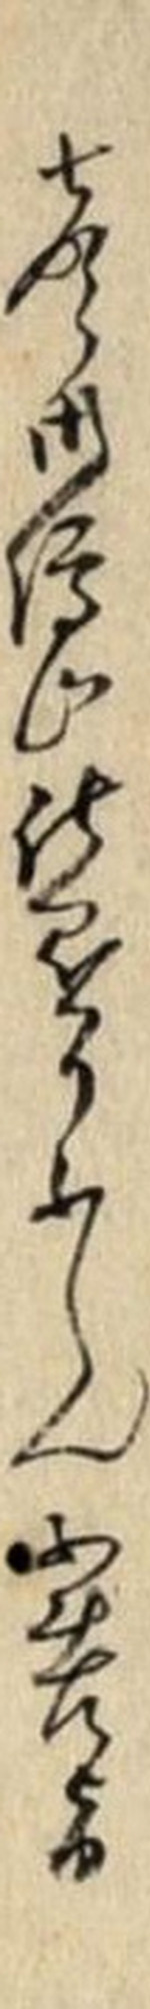声御停止仕懸りふしん不苦旨
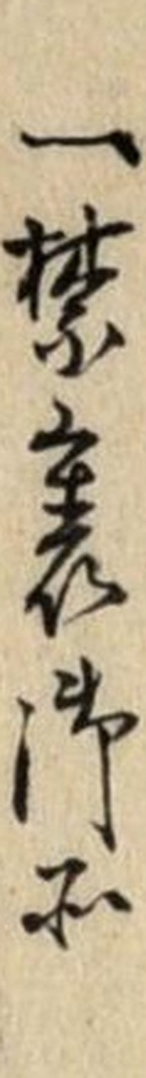一禁裏御所
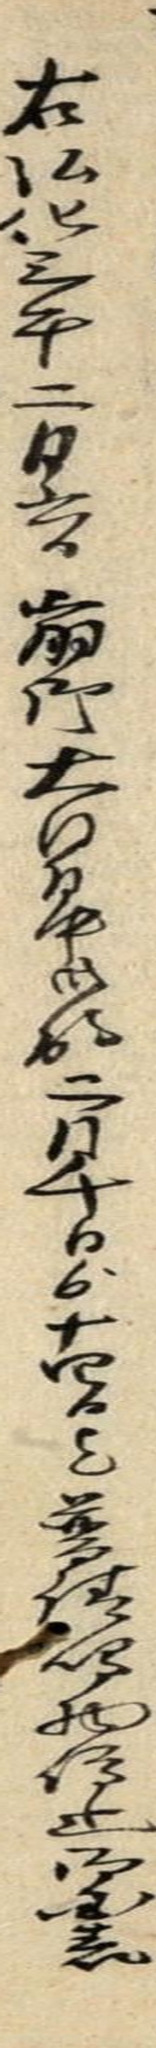右弘化三午二月六日崩御大目付中御触二月十日ゟ十四日迄普請鳴物停止御国表
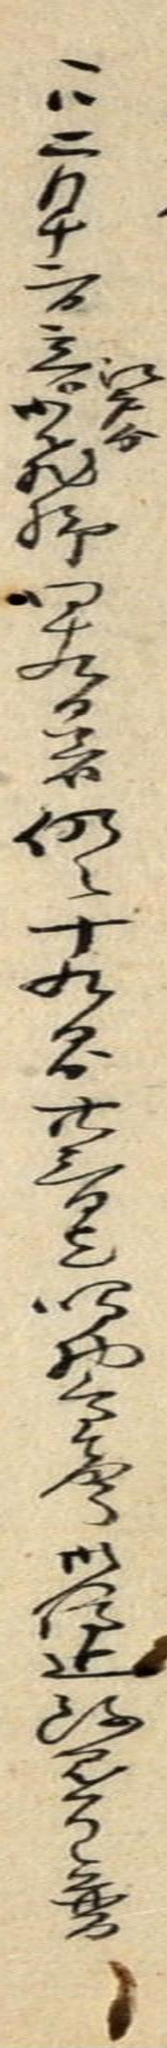へは二月十二日立◦江戸ゟ御飛脚同十九日着仍之十九日ゟ廿三日迄鳴物高声御停止致懸り候普
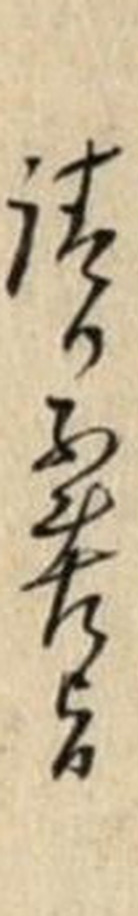請は不苦旨
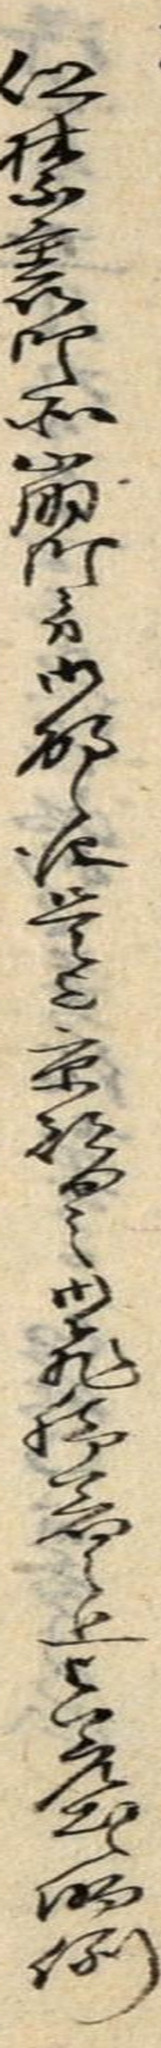但禁裏御所崩御に付御触之儀是迄京都ゟ之御飛脚着之上被差出候旧例
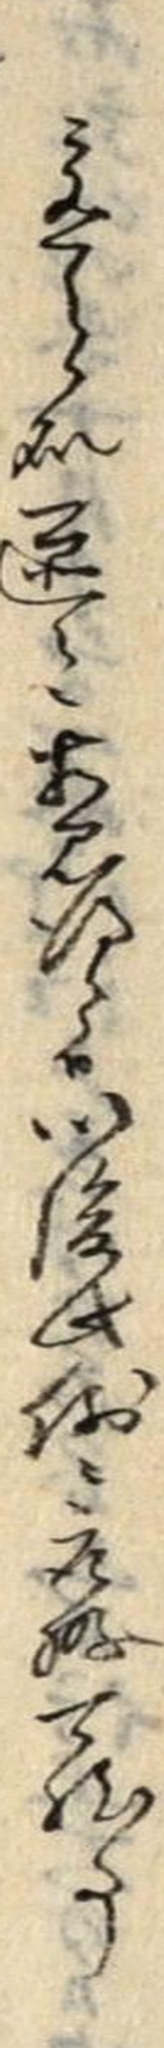に有之候処区々に相見得候に付以後此例に取扱可然事
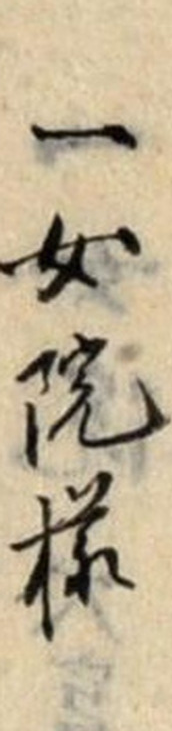一女院様
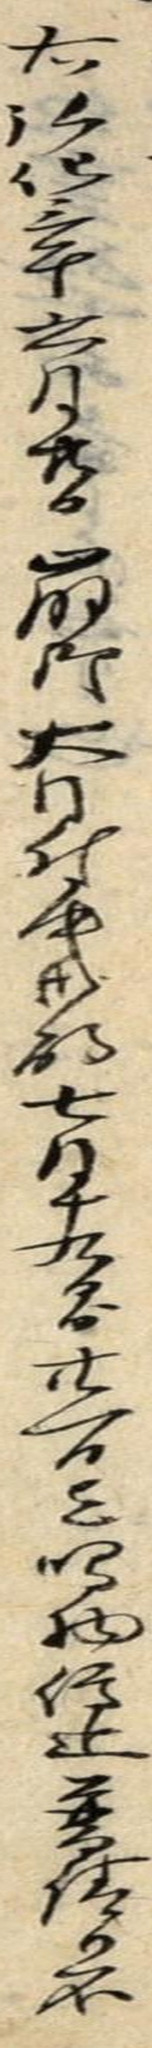右弘化三午六月廿日崩御大目付中御触七月十九日ゟ廿一日迄鳴物停止普請は不
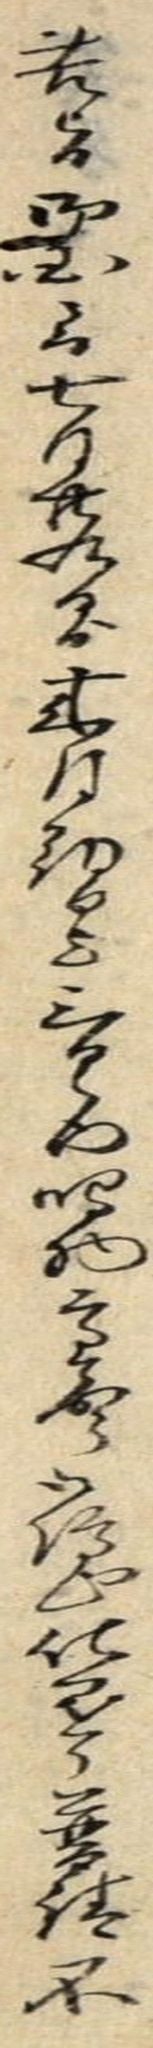苦旨御国にて七月廿九日ゟ来月朔日迄三日之内鳴物高声御停止仕懸り普請不

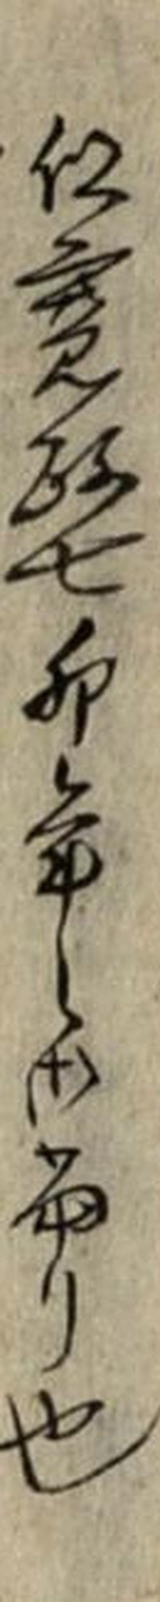但寛政七卯年之御当り也
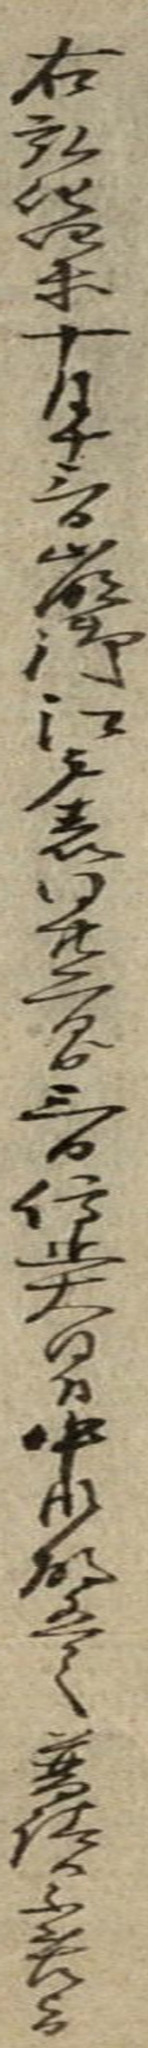右弘化四未十月十三日崩御江戸表同廿二日ゟ三日停止大目付中御触有之普請は不苦旨
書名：御停止異変死失
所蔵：福井県文書館 Fukui Prefectural Archives
